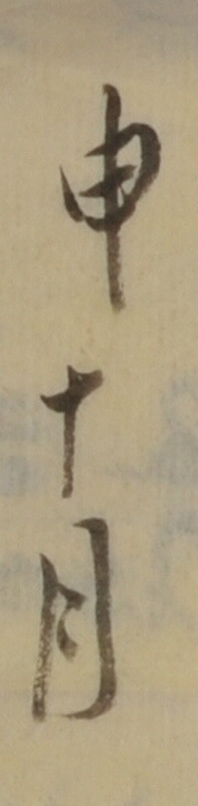申十月
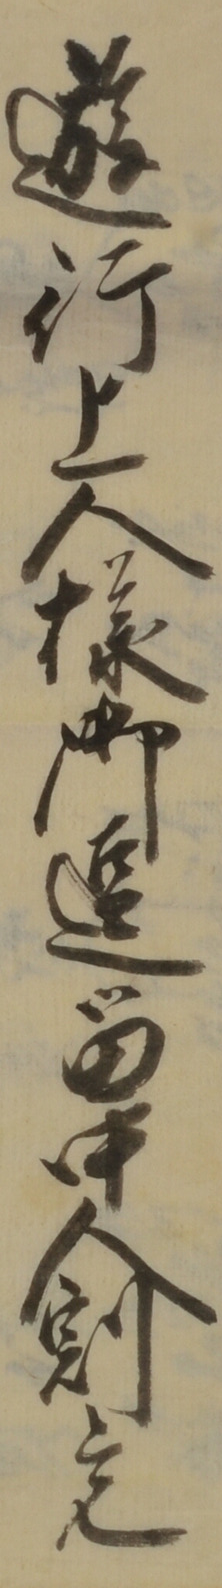遊行上人様御逗留中人割覚
